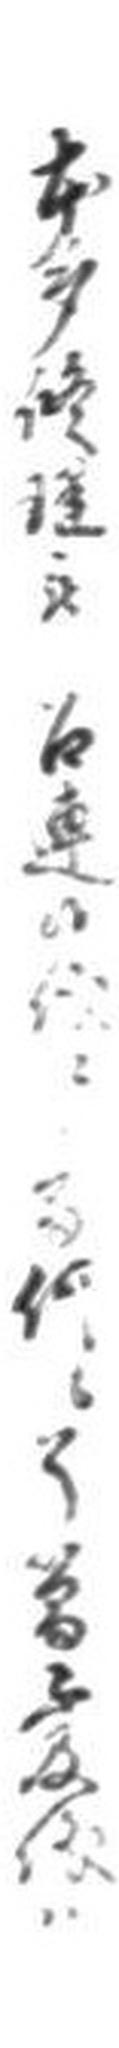本多修理被召連候儀ニ候間何も了簡不及儀ハ
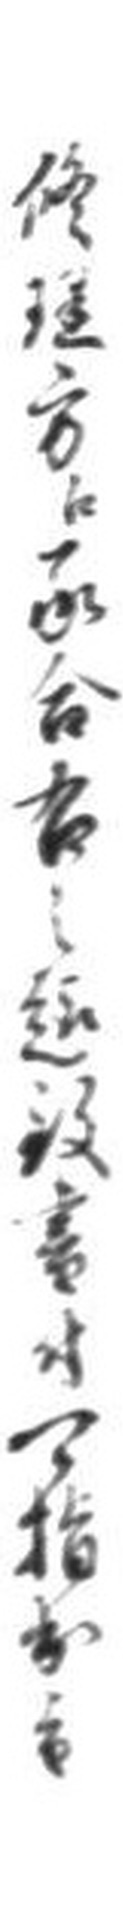修理方江承合右之趣致書付可指出旨

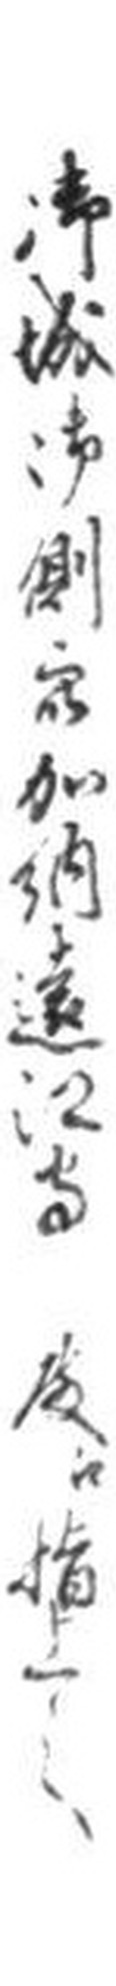御城御側衆加納遠江守殿江指上之
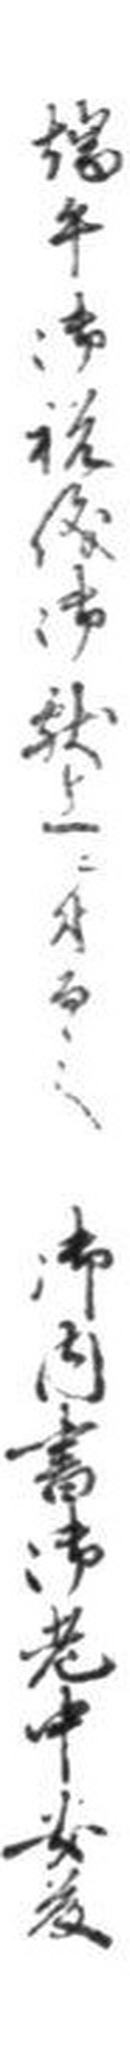端午御祝儀御献上ニ付而之御内書御老中安藤
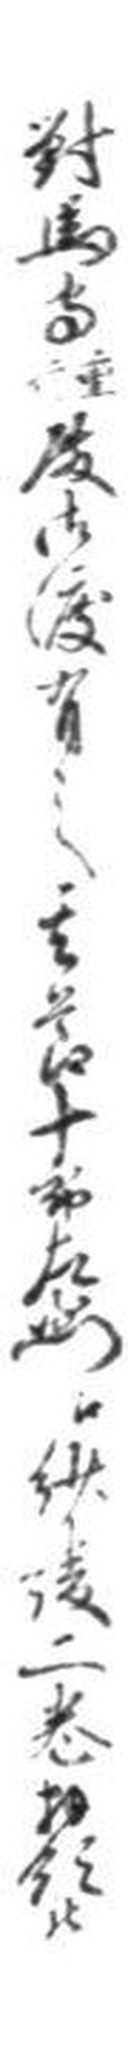行殿御渡有之其節十郎左衛門江紗綾二巻拝領被
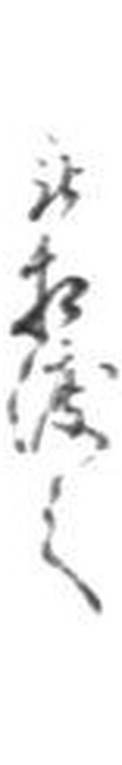被相渡之
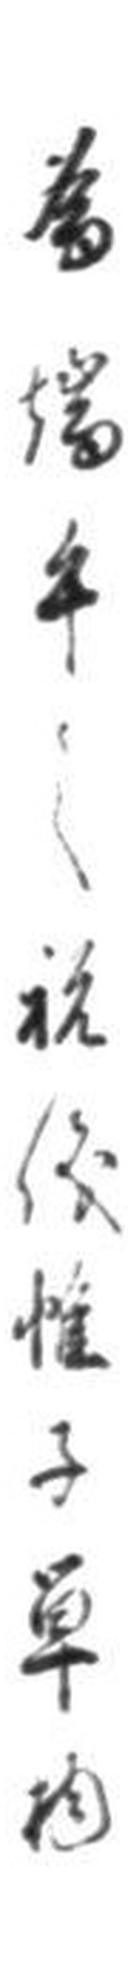為端午之祝儀帷子単物
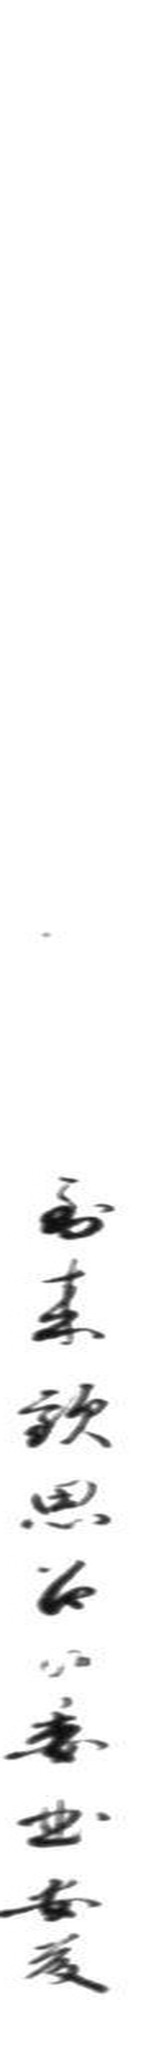到来歓思召候委曲安藤
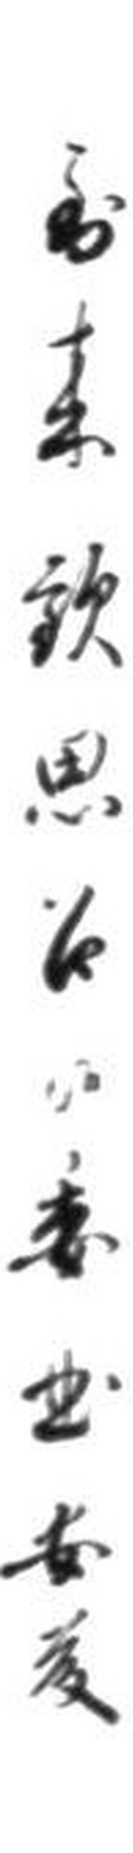到来歓思召候委曲安藤
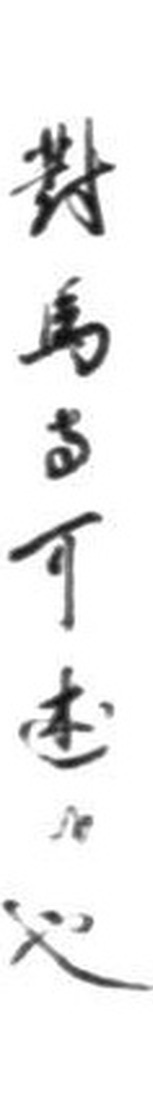対馬守可述候也
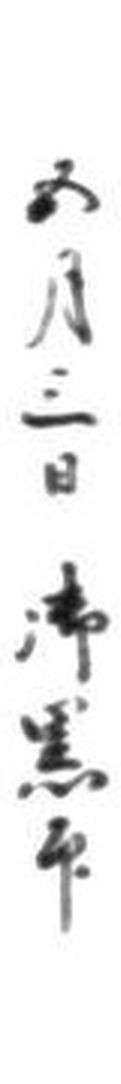五月三日御黒印
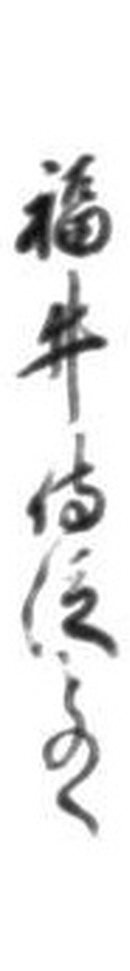福井侍従とのへ
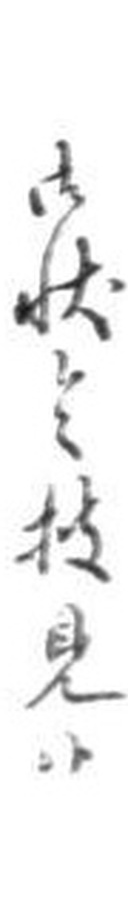御状令披見候
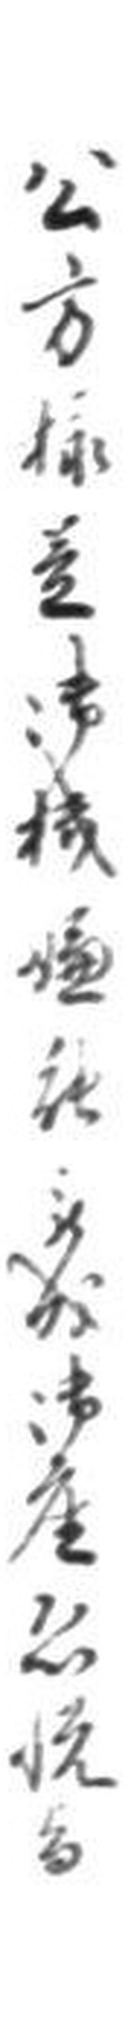公方様益御機嫌能被成御座恐悦旨
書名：家譜 三十六 宗昌公 従享保八年到同九年
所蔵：福井県文書館 Fukui Prefectural Archives
